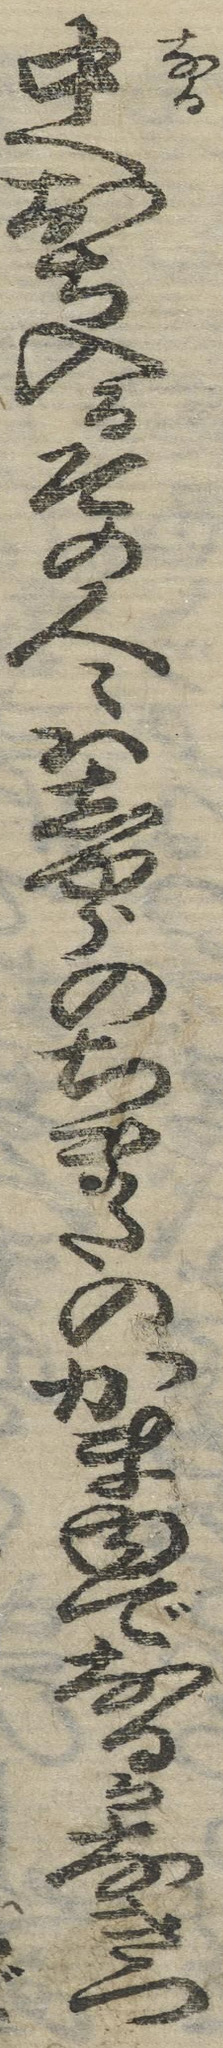中へおち入るその人〻はしゆらのちまたのかまゆでなるかなきつ
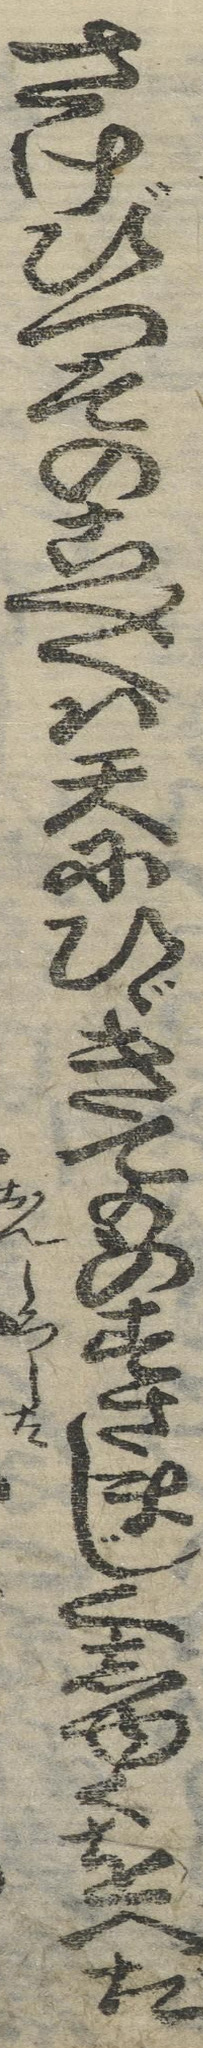さけびつそのこへ〳〵は天にひゞきてものすさましくしゆくをへだ
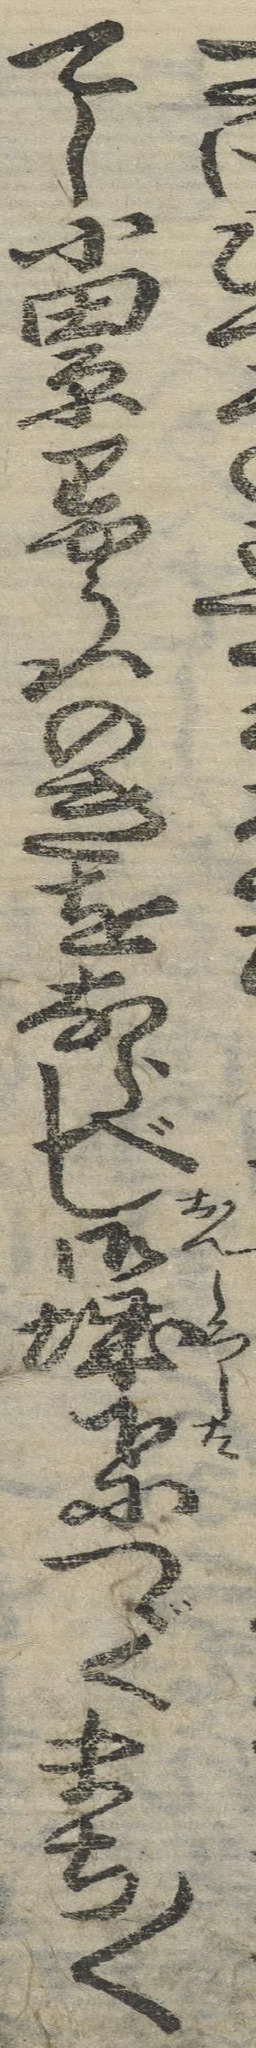てし小田原りやうはのきをならべし御城下につゞくまち〳〵
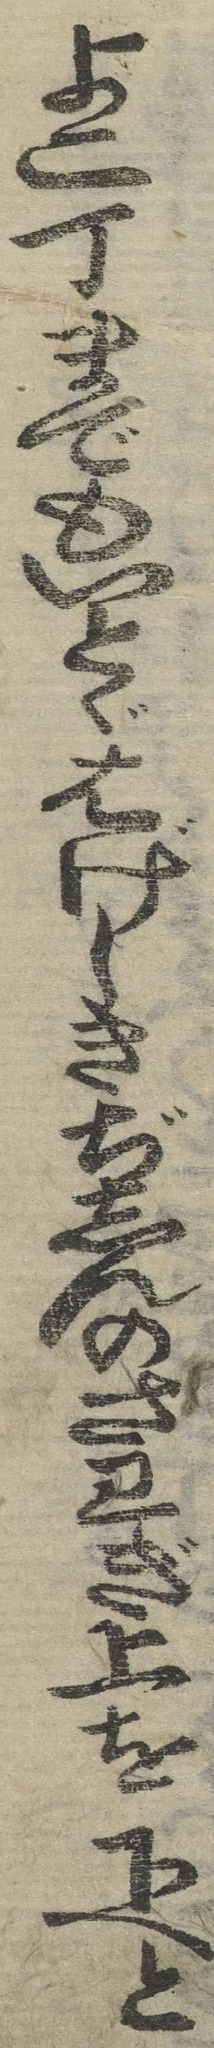よこ丁までもいとゞはげしきぢしんのさわぎ上を下へと

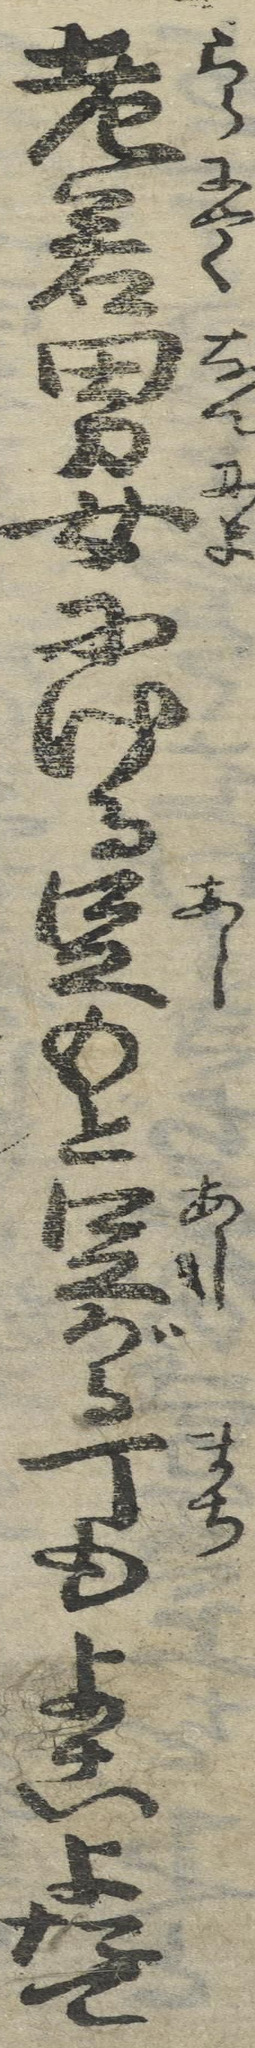老若男女にける足がる丁もよこよたて
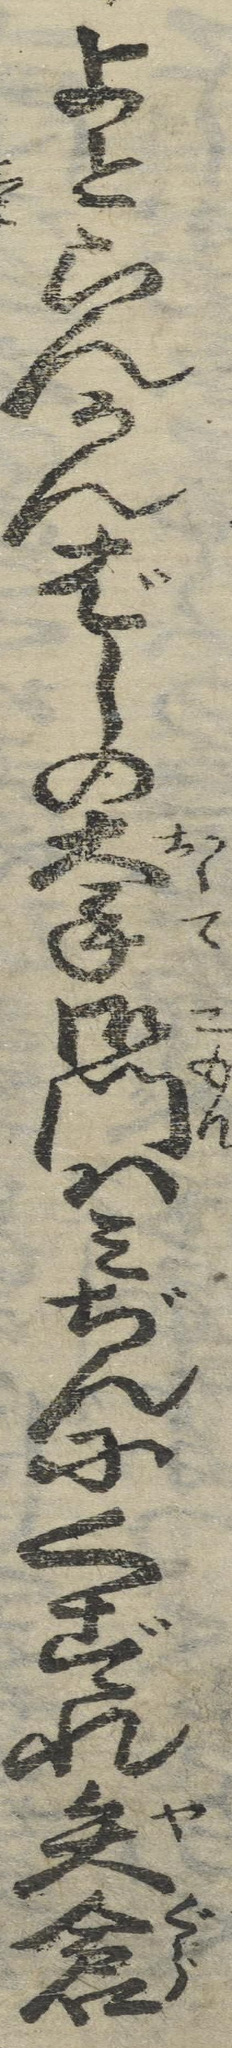よとらんかんばしの大手御門はみぢんにくずれ矢倉
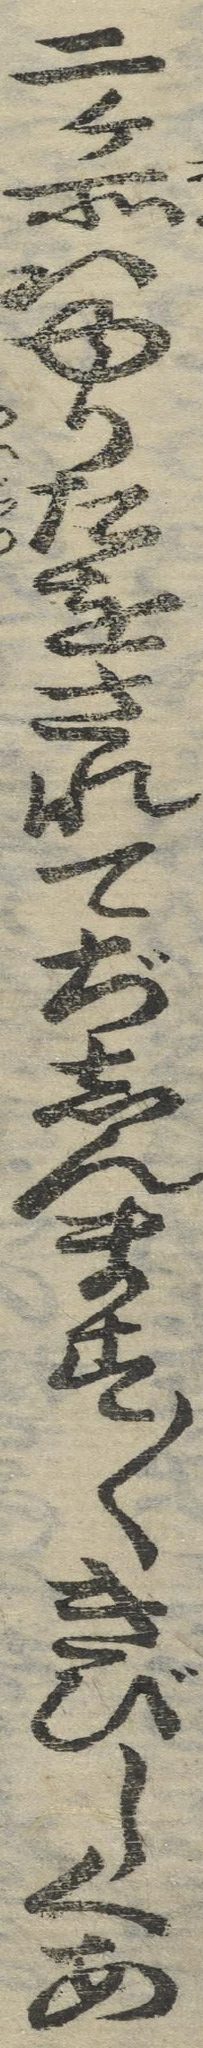二ヶ所はゆりたをされてぢしんます〳〵きびしくあ
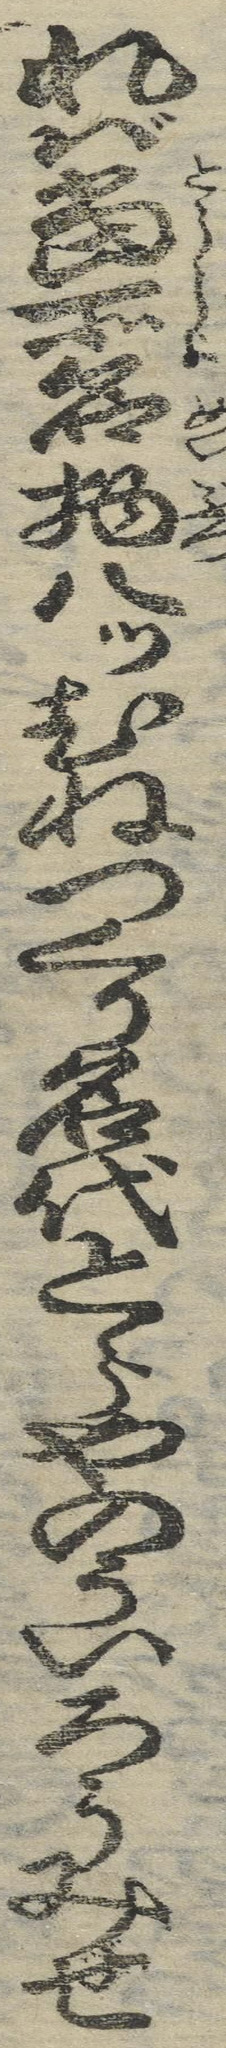れば当所名物八ツむねつくり名代とらやのういろうみせ
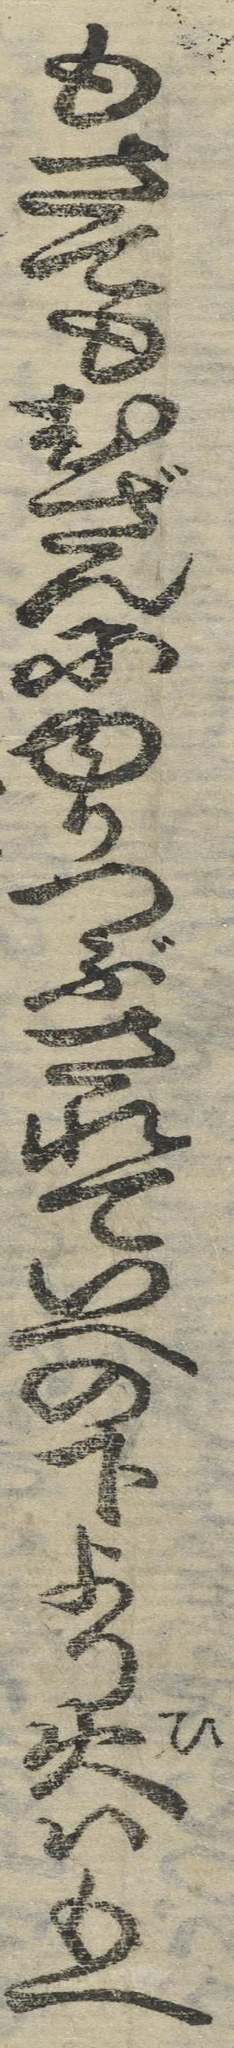もさてもむざんにゆりつぶされていへの下より火はもへ
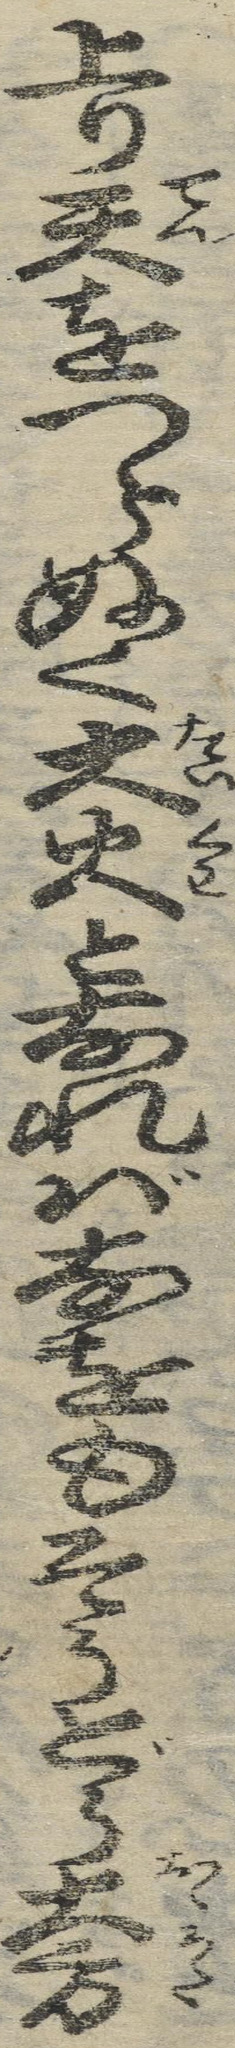上り天をつらぬく大火となればなをもそうとう大方
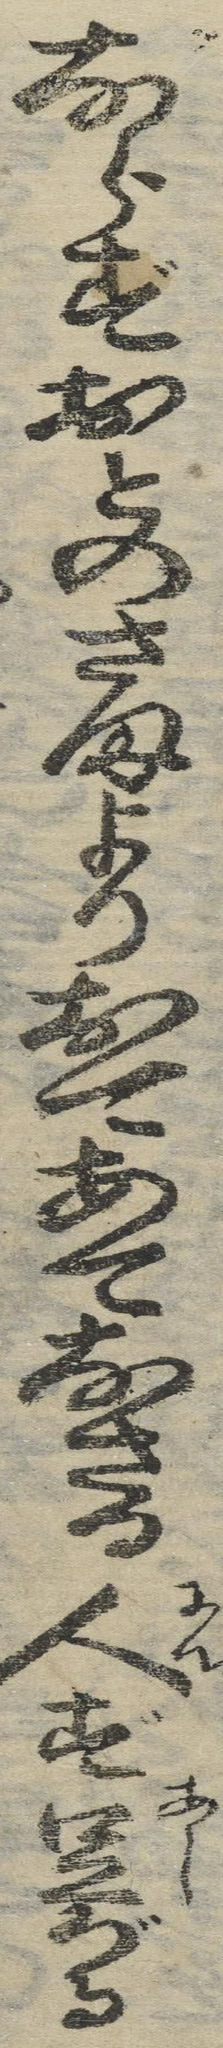ならずおとのさたよりおてあてなさる人ず足がる
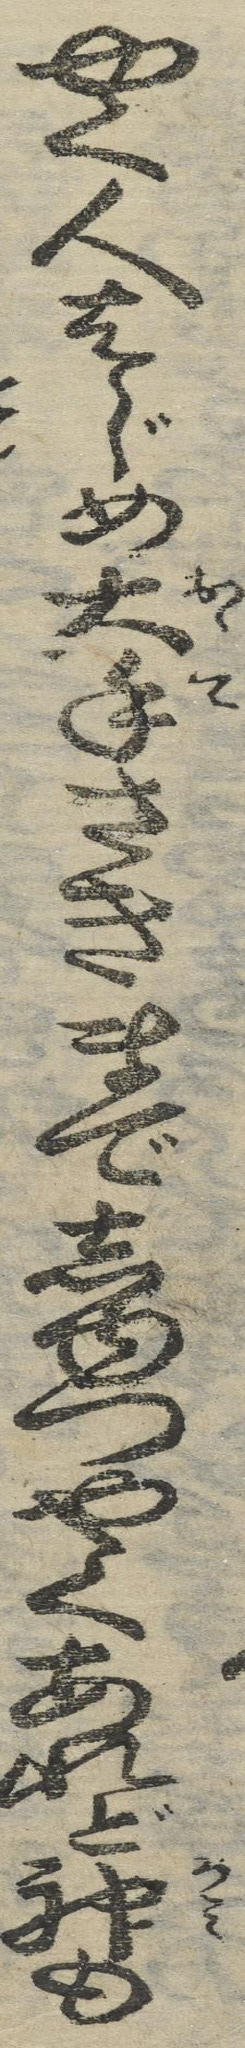ゆく人はじめ大手さきまでしゆつやくあれど神も
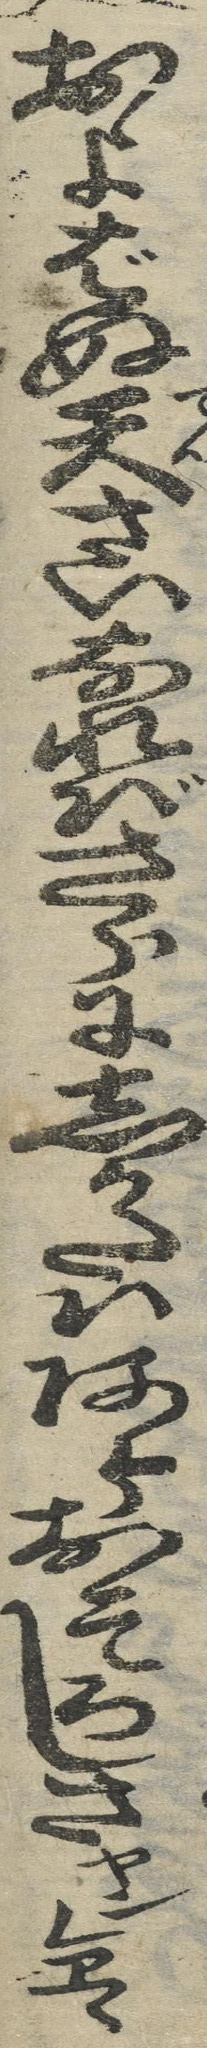およばぬ天さいなればさらにしかたはあらおそろしさヤンレエゝ
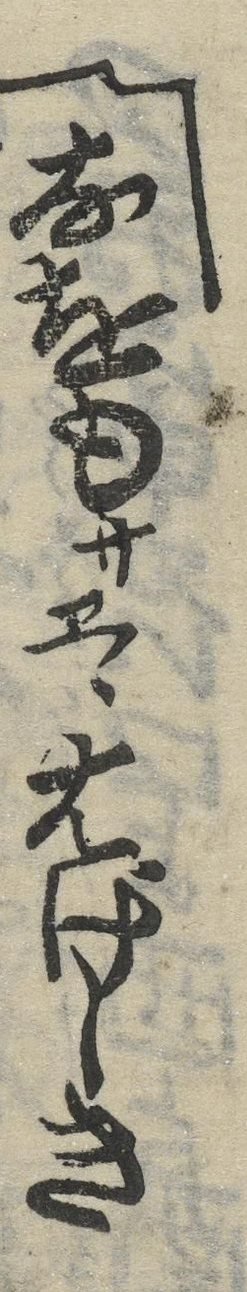〽なをもサエゝはげしき下
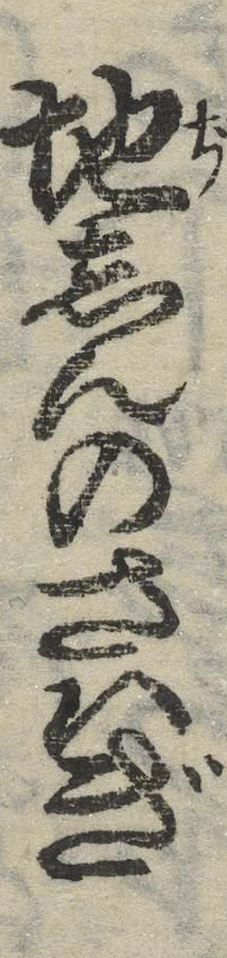地しんのさはぎ
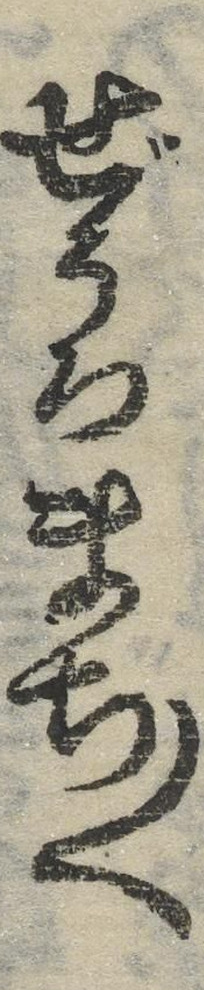ぜうるまち〳〵
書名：相州小田原箱根地震くどき
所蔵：東京大学地震研究所図書室 Earthquake Research Institute Library, The University of Tokyo, JAPAN
